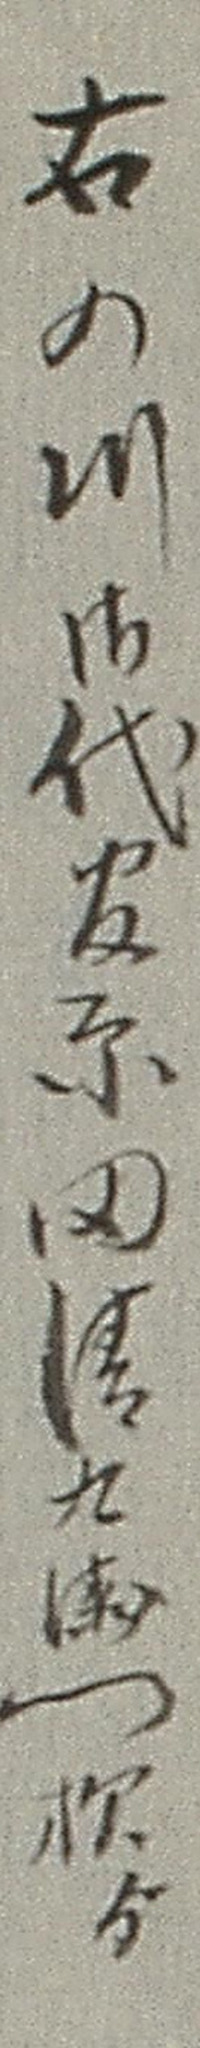右の川御代官原田清左衛門様ゟ
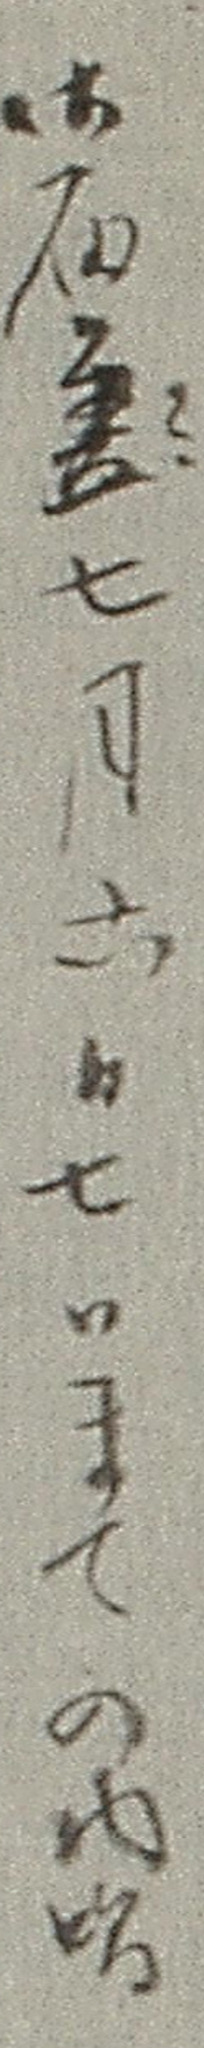御届書七月六日七日まての内鳴
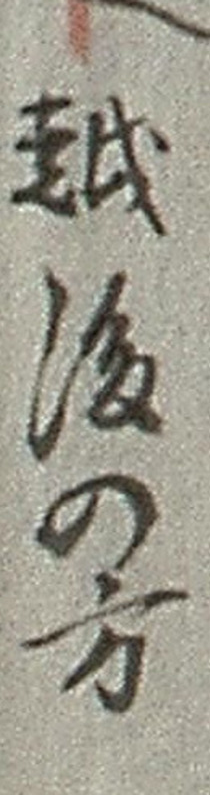越後の方
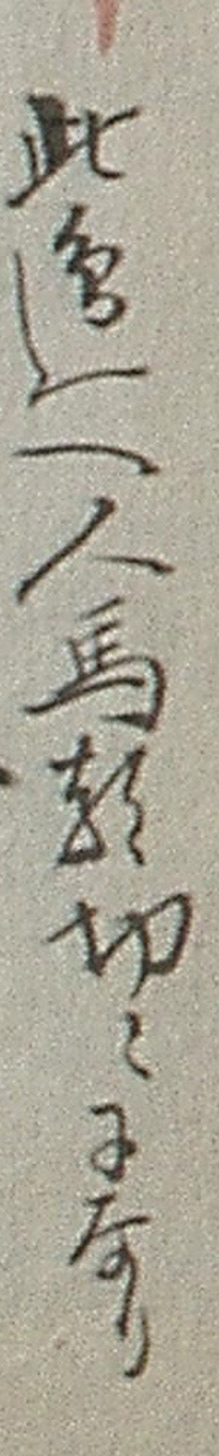り此辺へ人馬切々になり
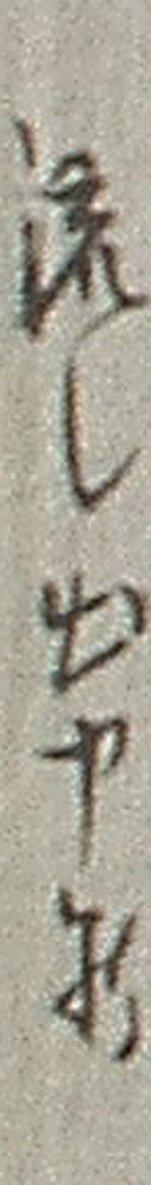流ㇾ出申候
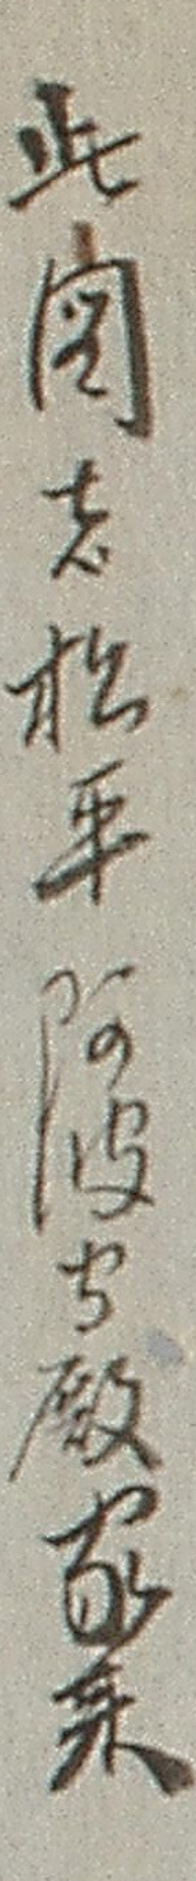此図は松平阿波守殿家来
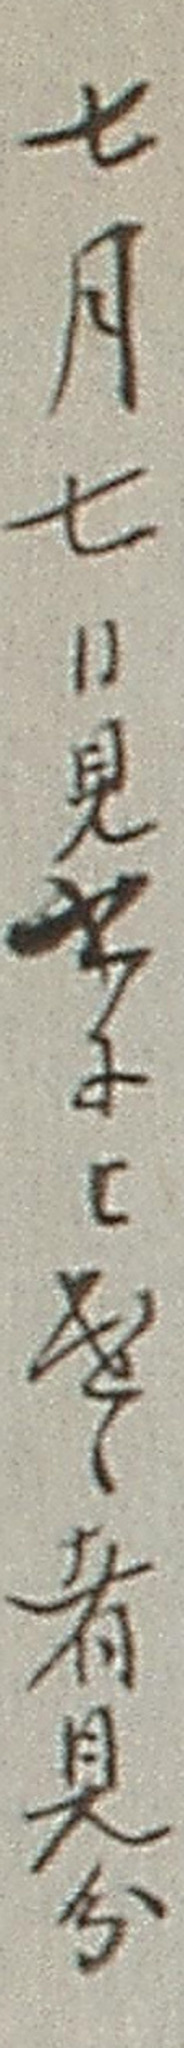七月七日見せに被遣候者見分
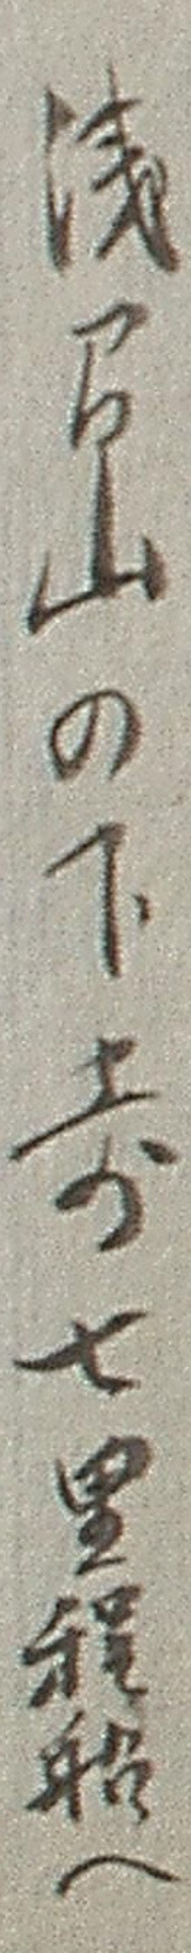浅間山の下寄七里程船へ
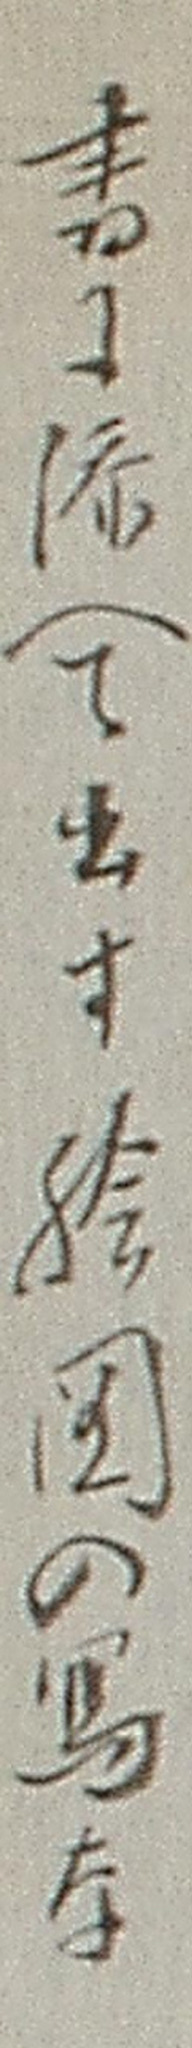書に添へて出す絵図の写な
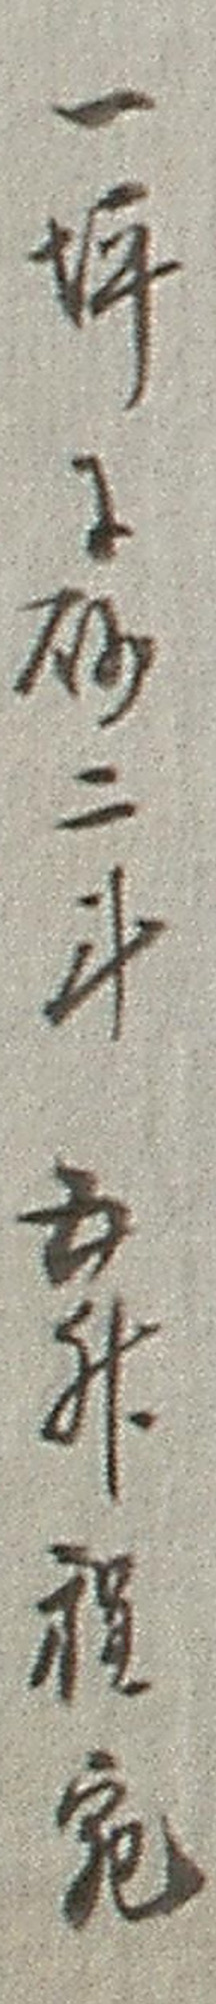一坪に砂二斗五升程宛
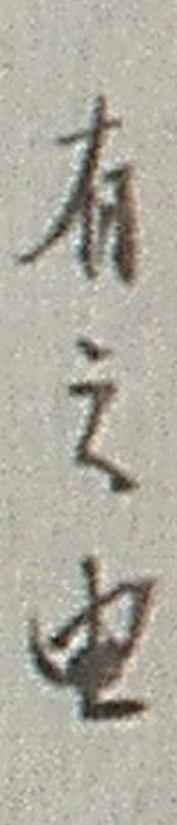有之由

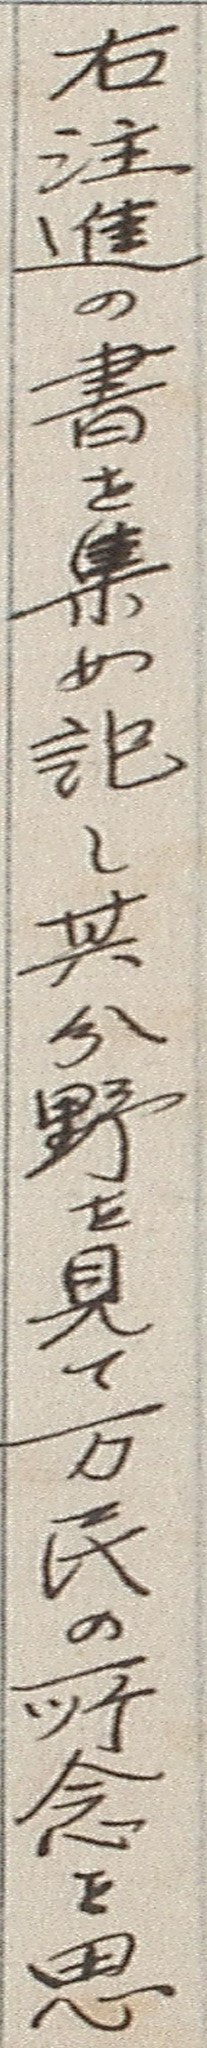右注進の書を集め記し其分野を見て万民の所念を思
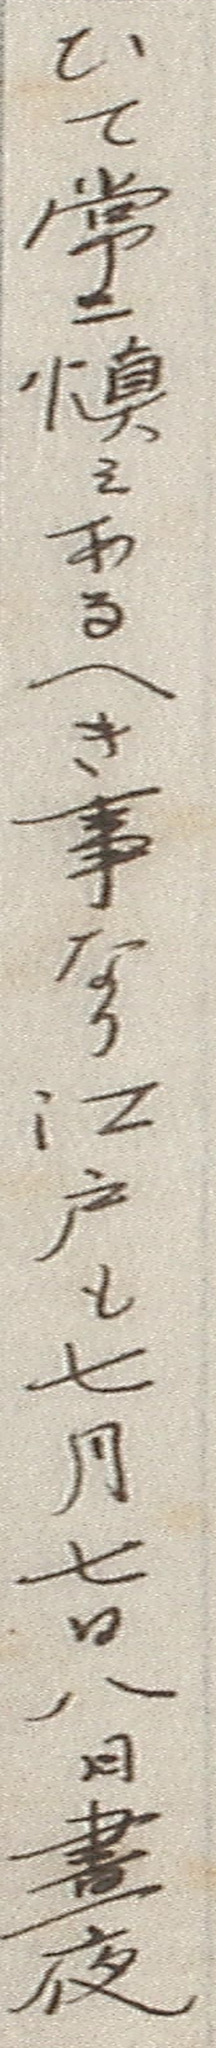ひて常ニ慎ミあるへき事なり江戸も七月七日八日晝夜
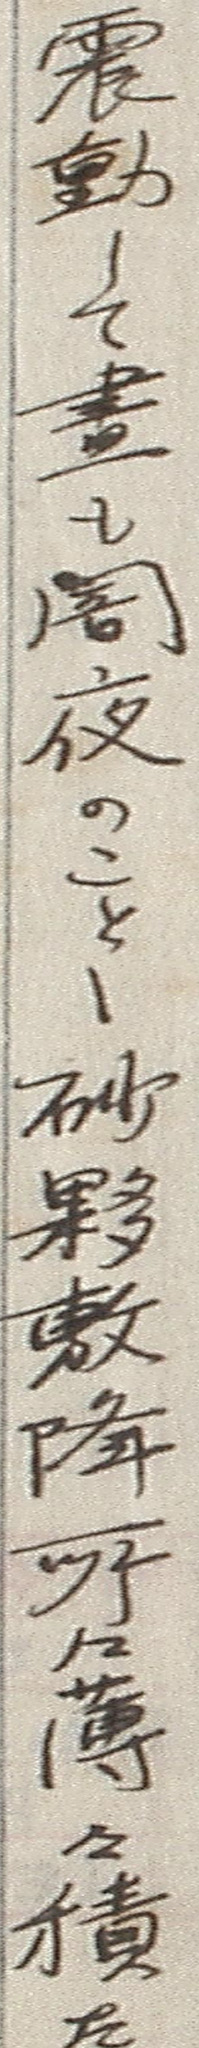震動して晝も闇夜のことし砂夥敷降所に薄々積た
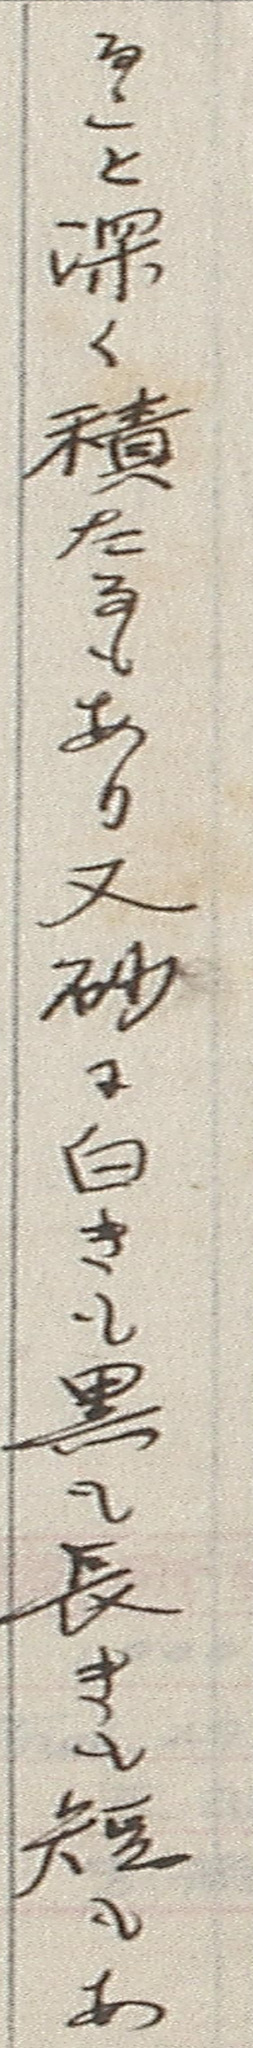ること深く積たるもあり又砂に白きも黒も長きも短もあ
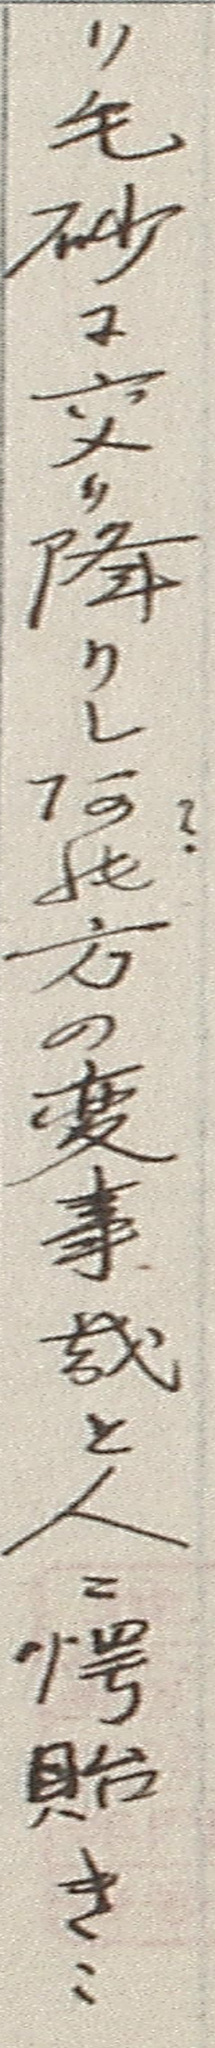り毛砂に交り降りしあの？方の変事哉と人に愕貽きこ
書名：浅間山焼出記
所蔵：東京大学地震研究所図書室 Earthquake Research Institute Library, The University of Tokyo, JAPAN
